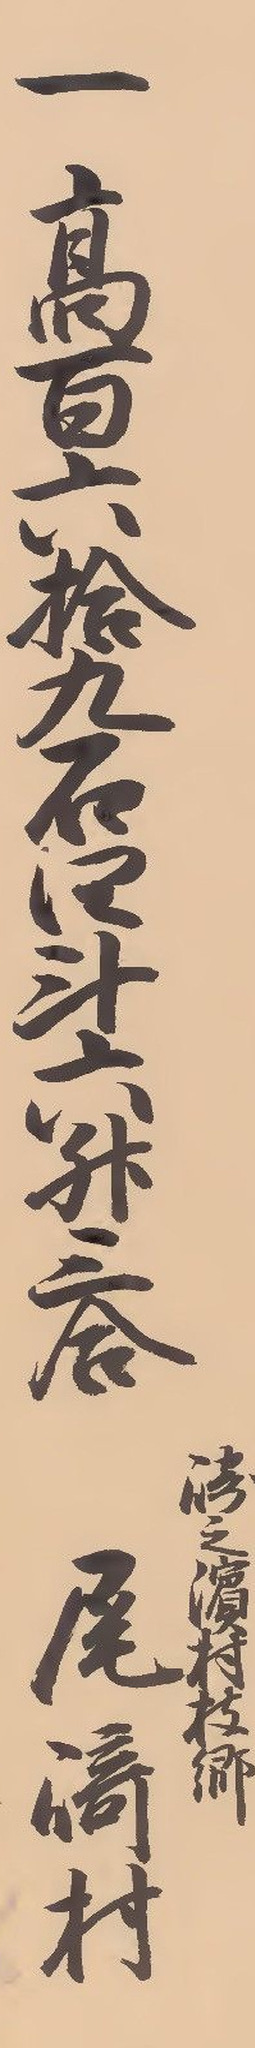一髙百六拾九石四斗六升三合尾崎村

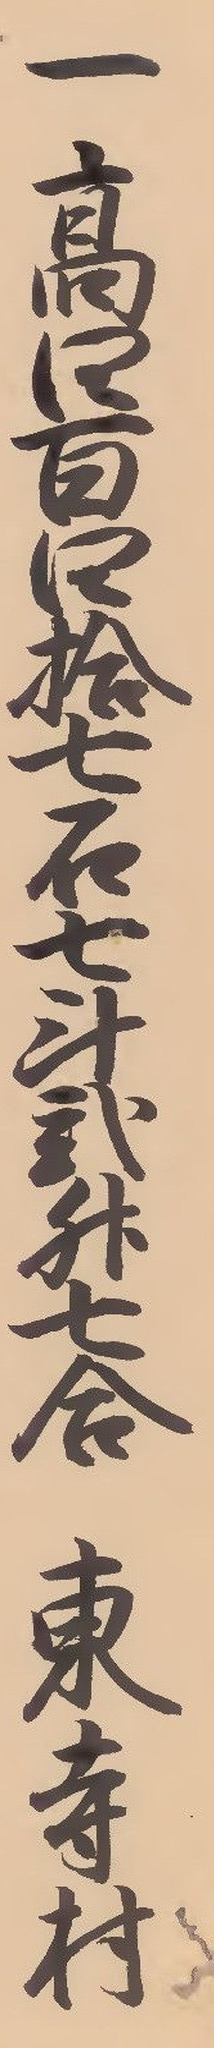一髙四百四拾七石七斗弐升七合東寺村
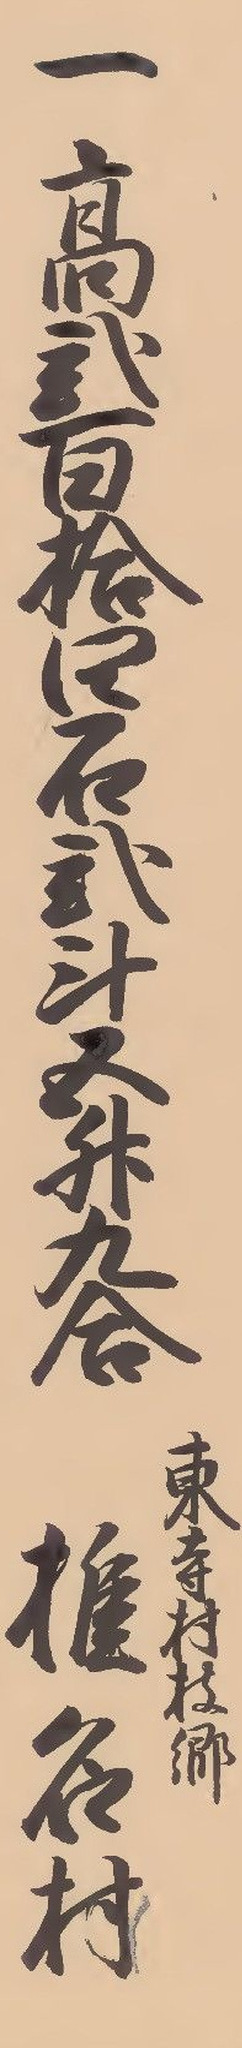一髙弐百拾四石弐斗五升九合椎名村
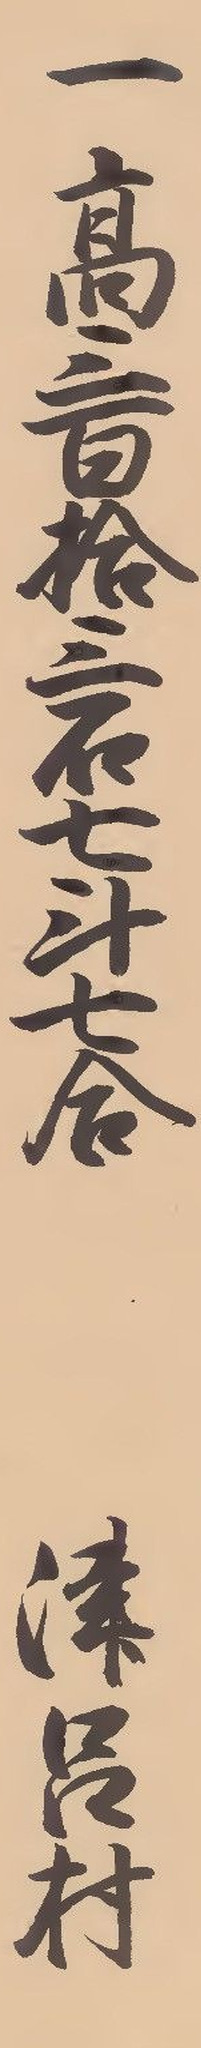一髙三百拾三石七斗七合津呂村
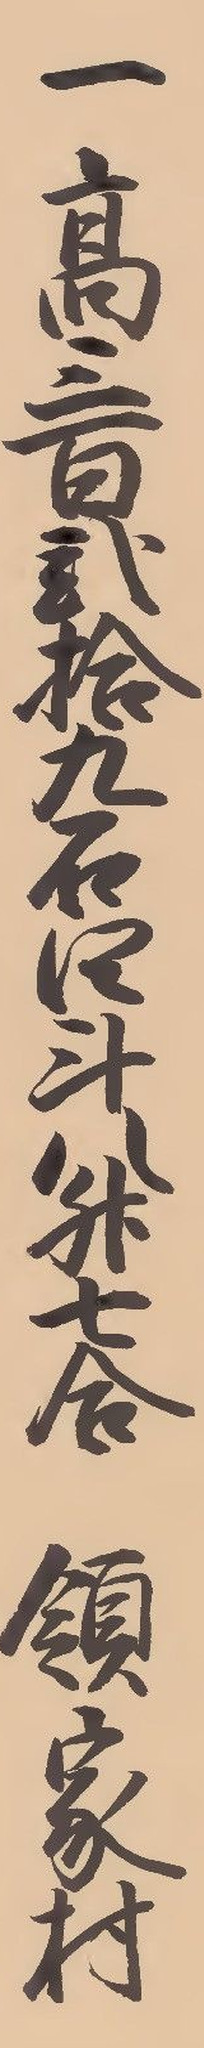一髙三百弐拾九石四斗八升七合領家村
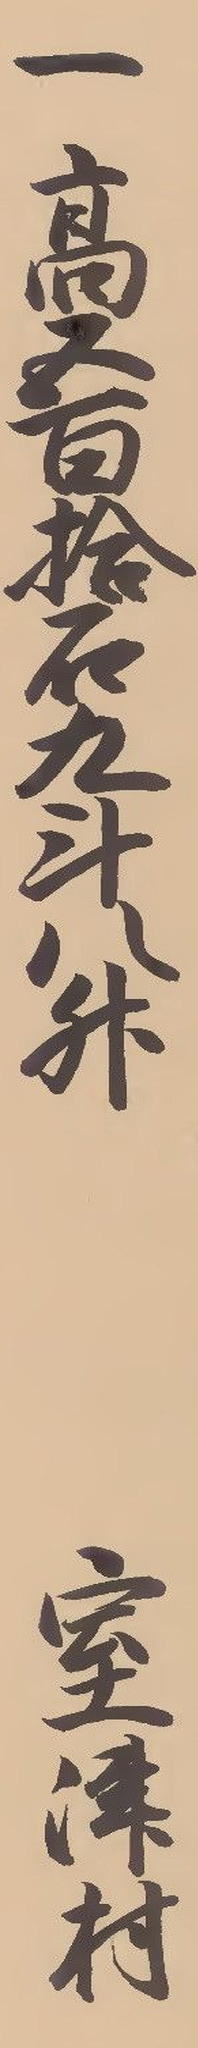一髙五百拾石九斗八升室津村
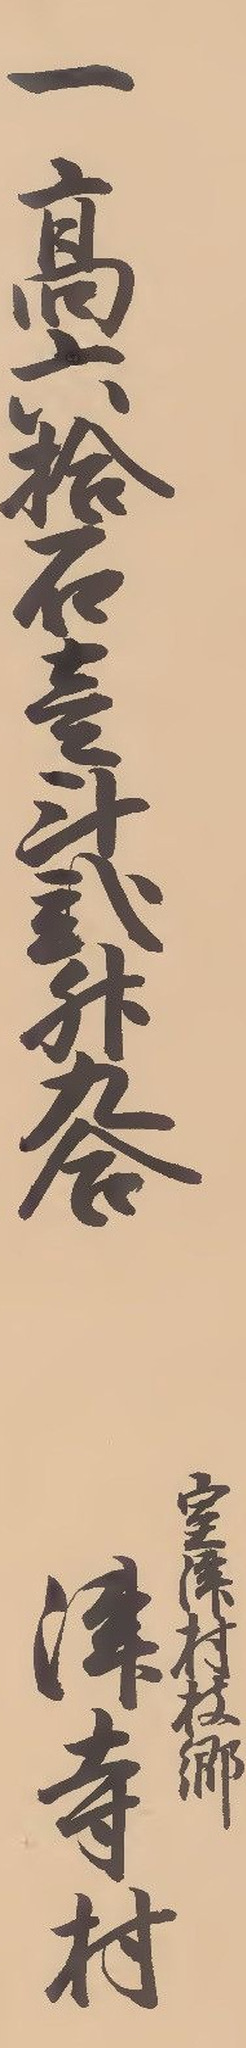一髙六拾石壱斗弐升九合津寺村
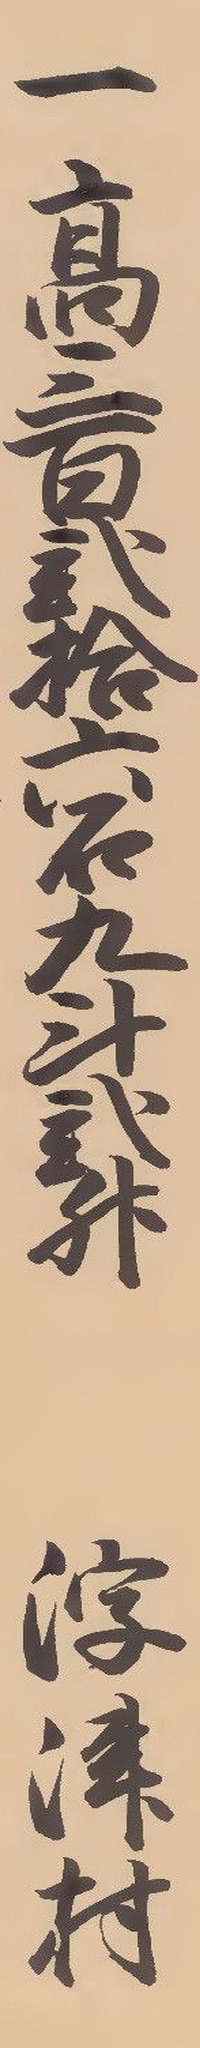一髙三百弐拾六石九斗弐升浮津村
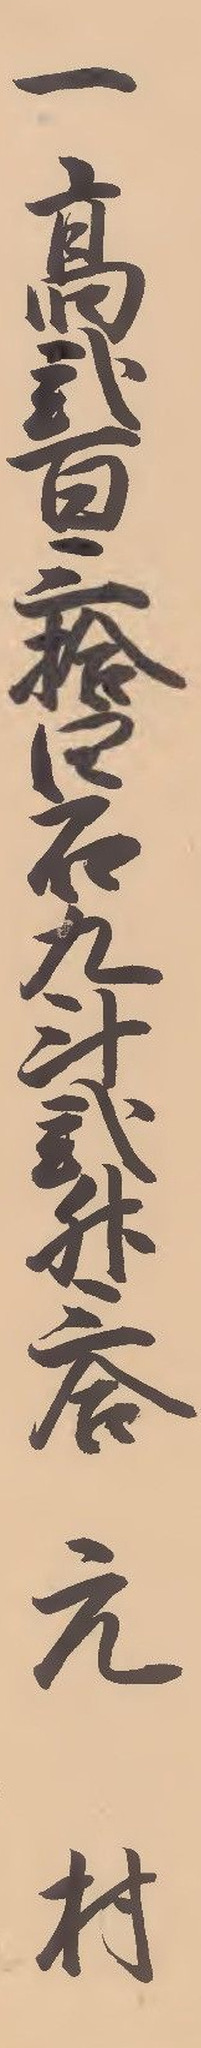一髙弐百三拾四石九斗弐升三合元村

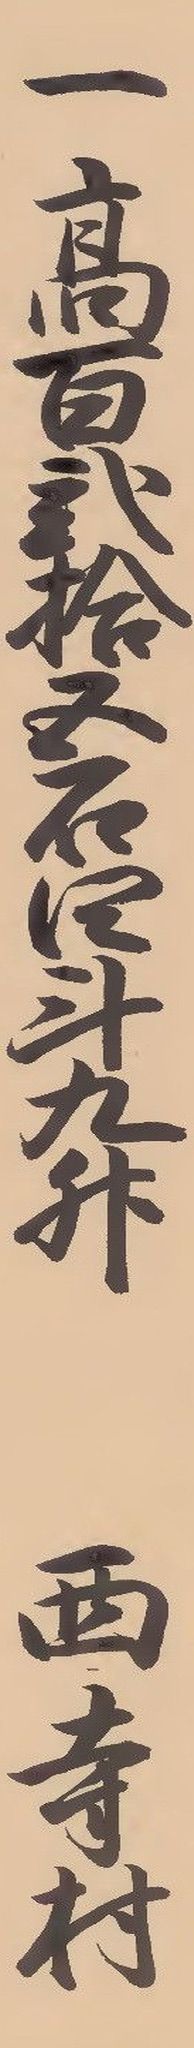一髙百弐拾五石四斗九升西寺村
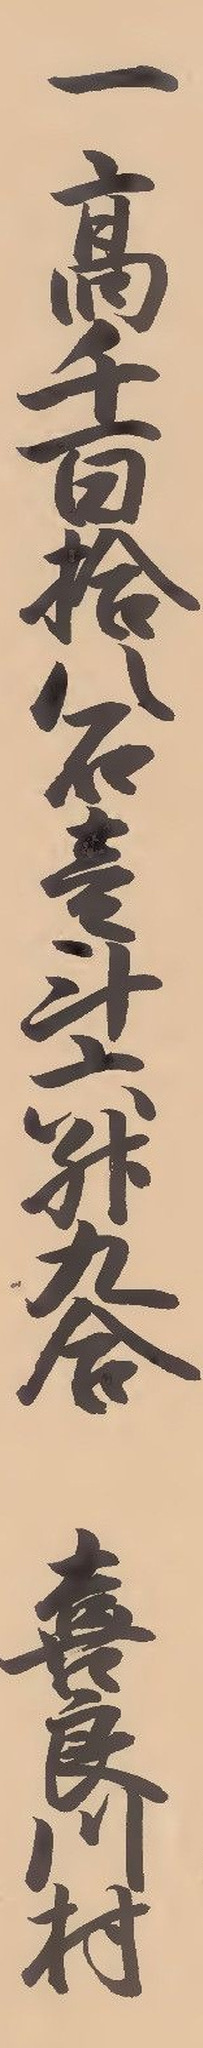一髙千百拾八石壱斗六升九合喜良川村
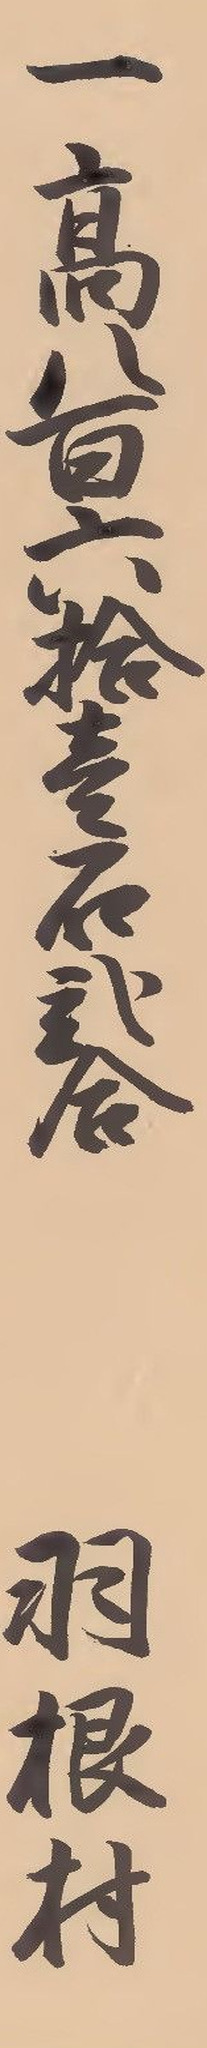一髙八百六拾壱石弐合羽根村
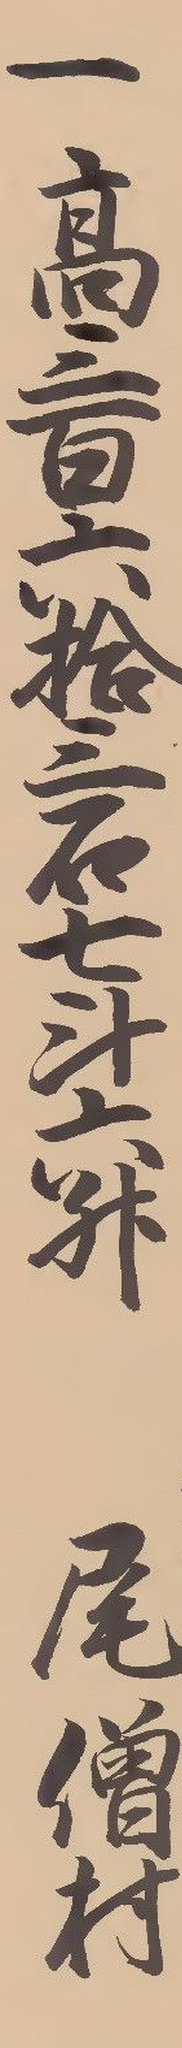一髙三百六拾三石七斗六升尾僧村
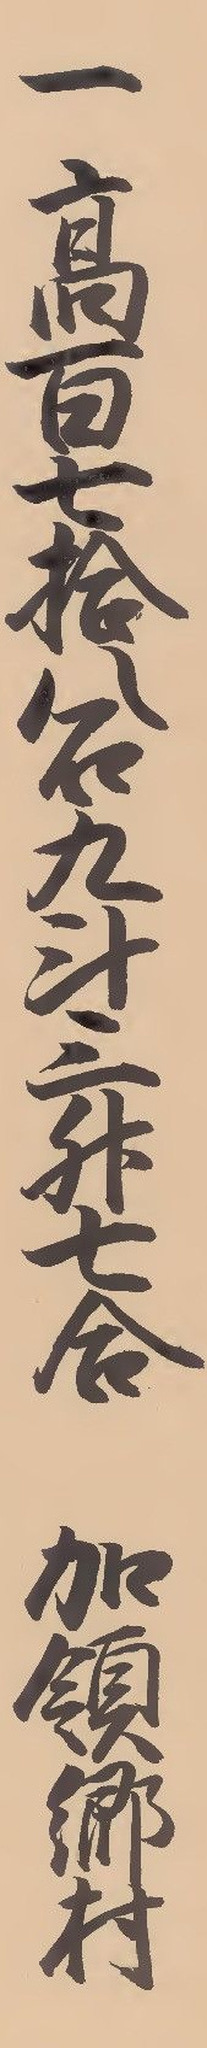一髙百七拾八石九斗三升七合加領郷村
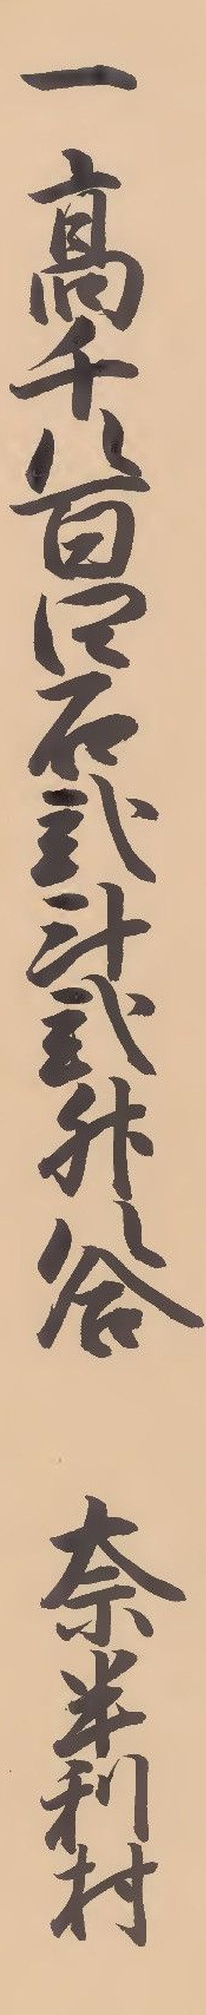一髙千八百四石弐斗弐升八合奈半利村

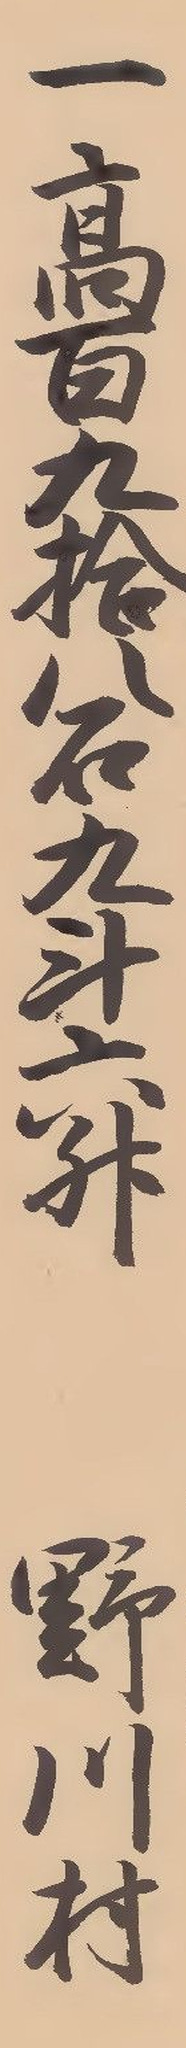一髙百九拾八石九斗六升野川村
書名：土佐国郷帳
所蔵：国立公文書館 National Archives of Japan
